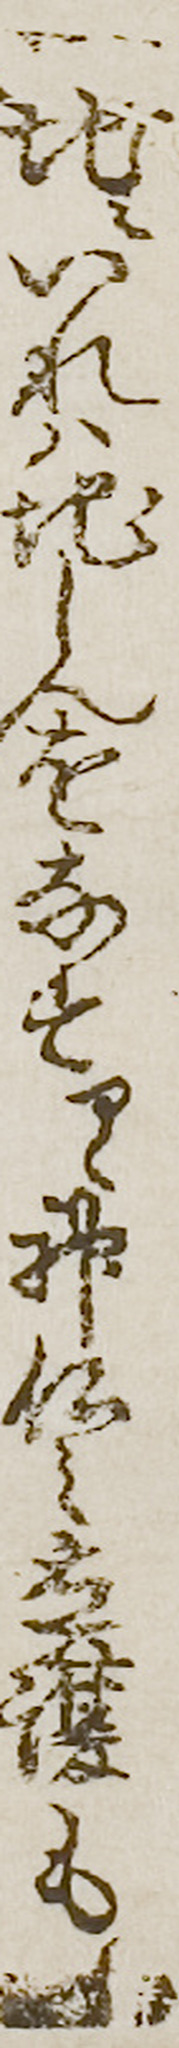地にいれは地しんをなすアヽ神仏の応護も
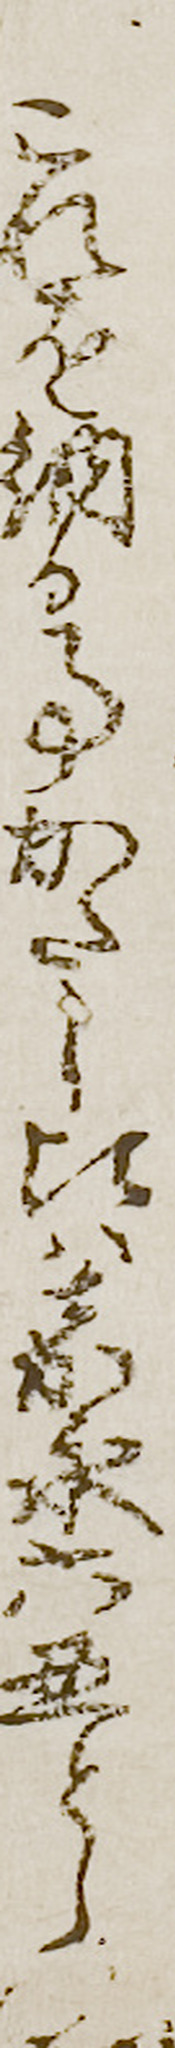これを納る事かたし比は嘉永六丑とし
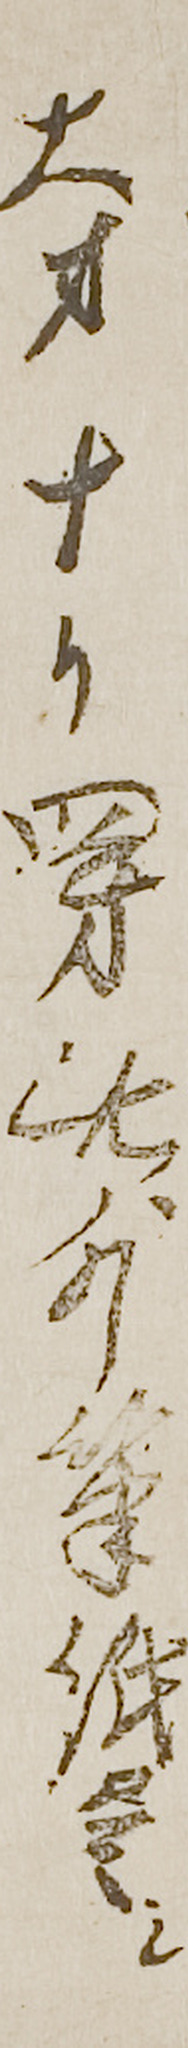大方十り四方此外筆紙尽し
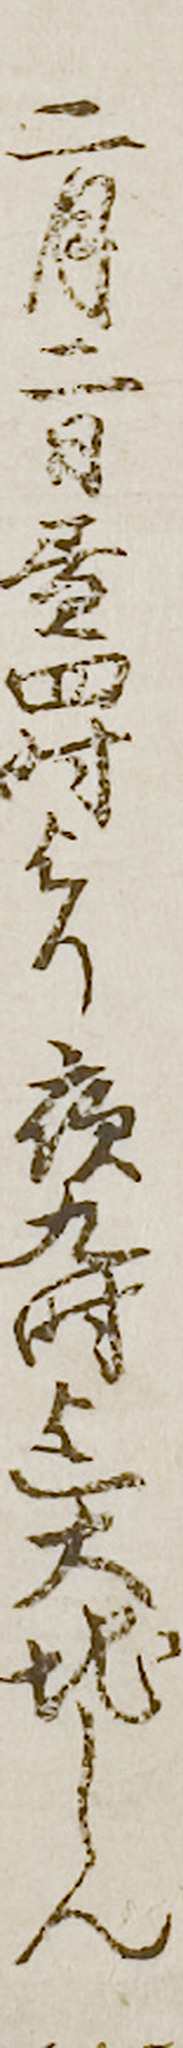二月二日昼四時より夜九時迄大地しん
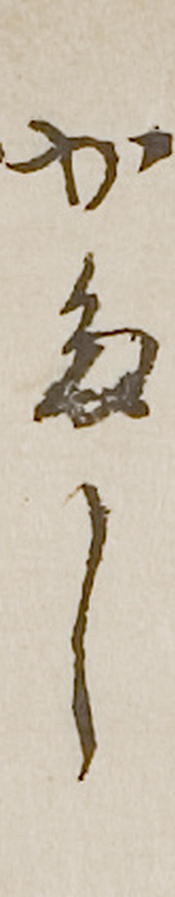かたし
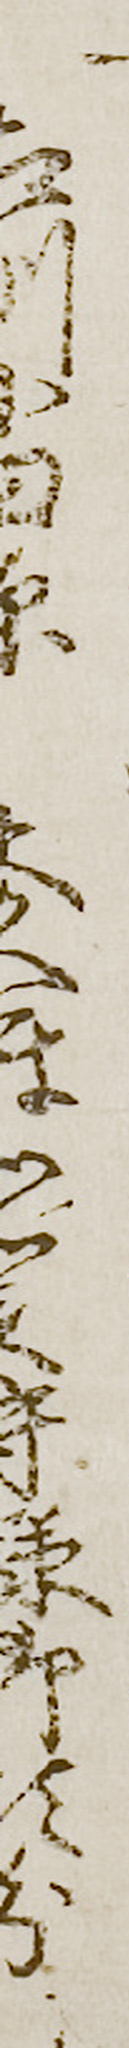相州小田原大久保加賀守様御領分
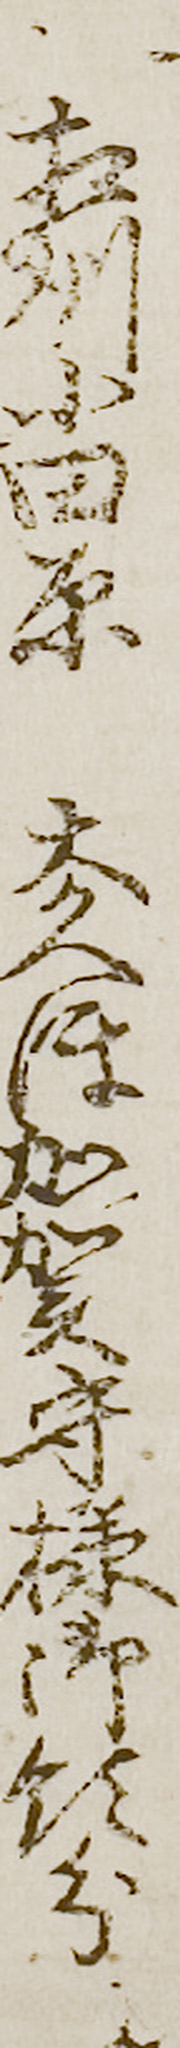相州小田原大久保加賀守様御領分
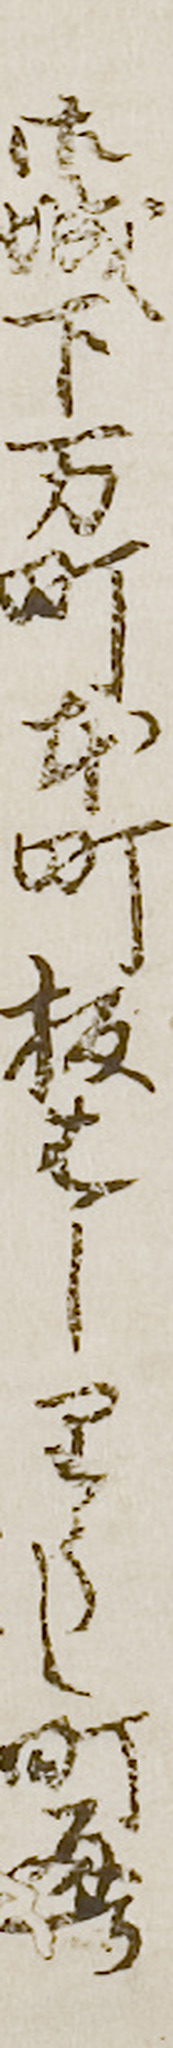御城下万町本町板はしりうし町通り
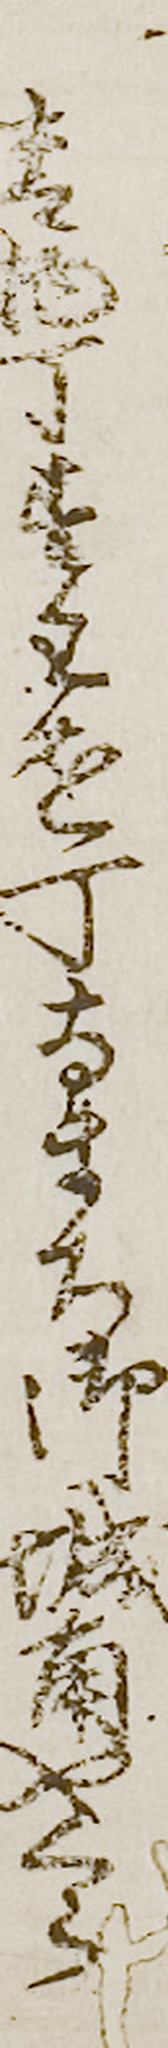青物丁すわを丁寺まち御城南やくら
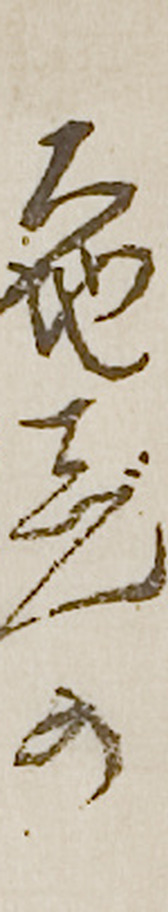大地しんの
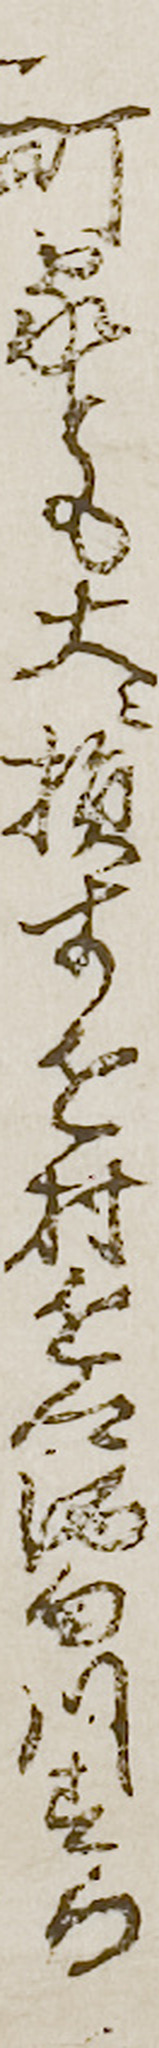町家とも大に損す近村近郷酒匂川すわ
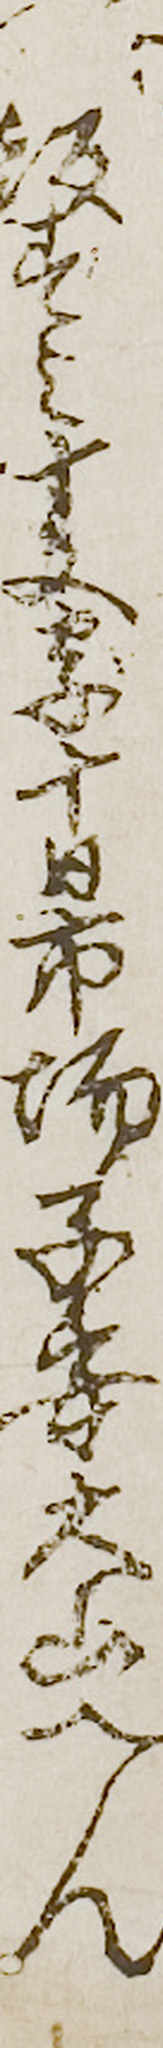飯すみ十文字十日市場子安大山へん
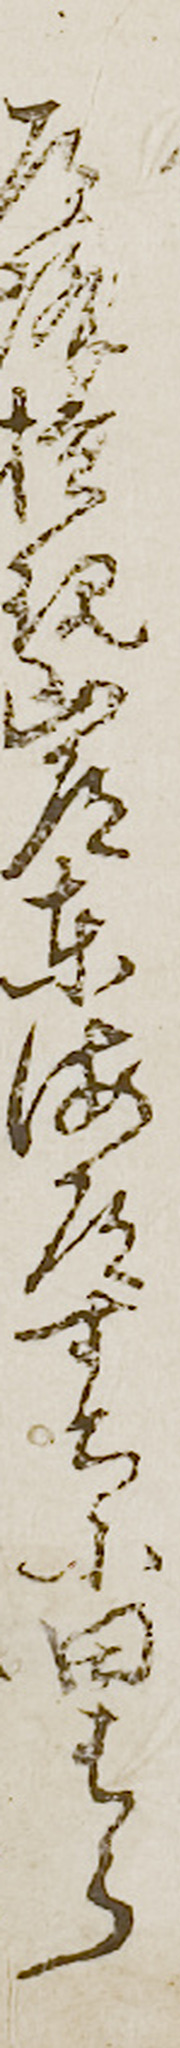雨降権現山道東海道すち小田はら
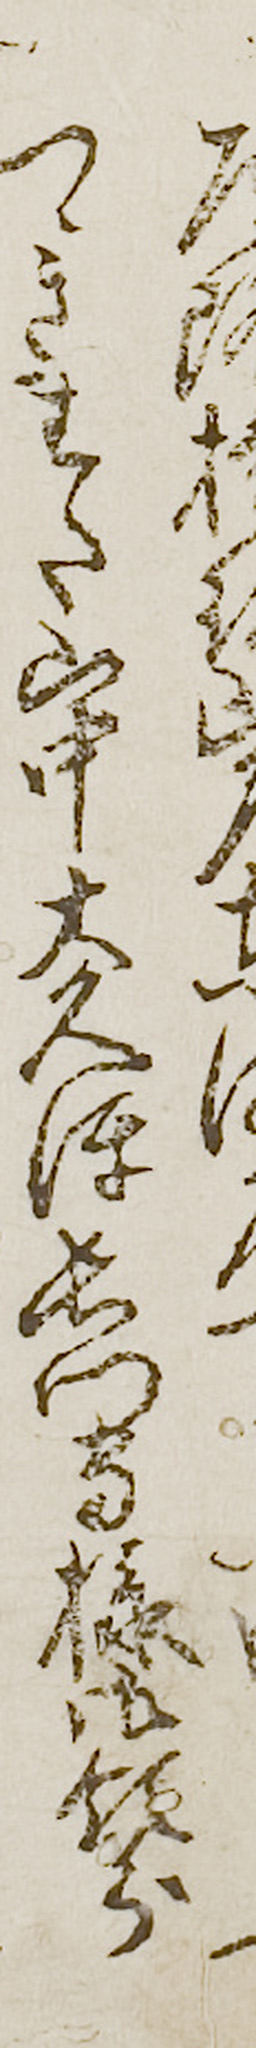つきはた山中大久保長門守様御領分
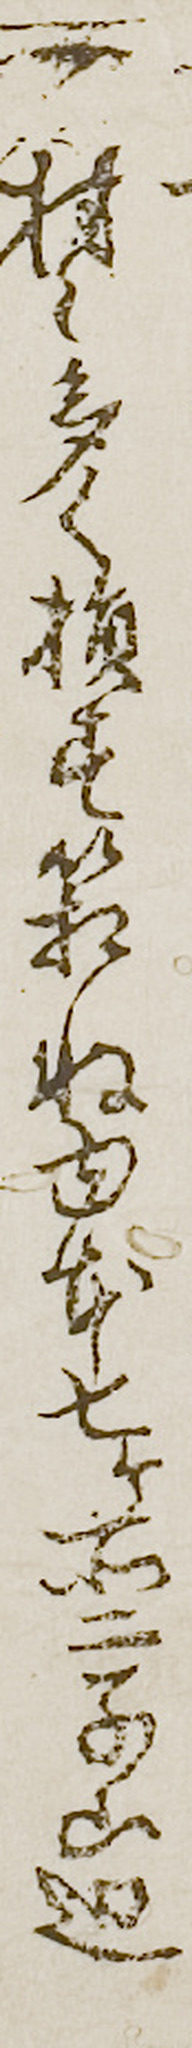村々多く損す箱ねゆ本七ケ所二子山辺
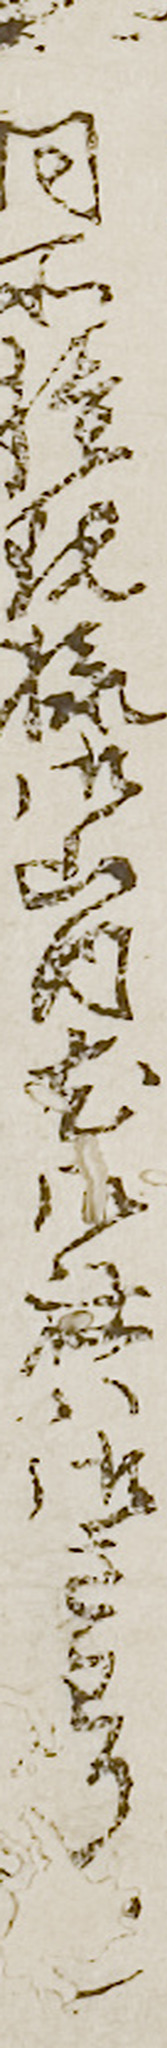同所権現様御山内尤御社は御さわり
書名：信州善光寺大ぢしんの次第
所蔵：東京大学総合図書館 General Library in the University of Tokyo, JAPAN
